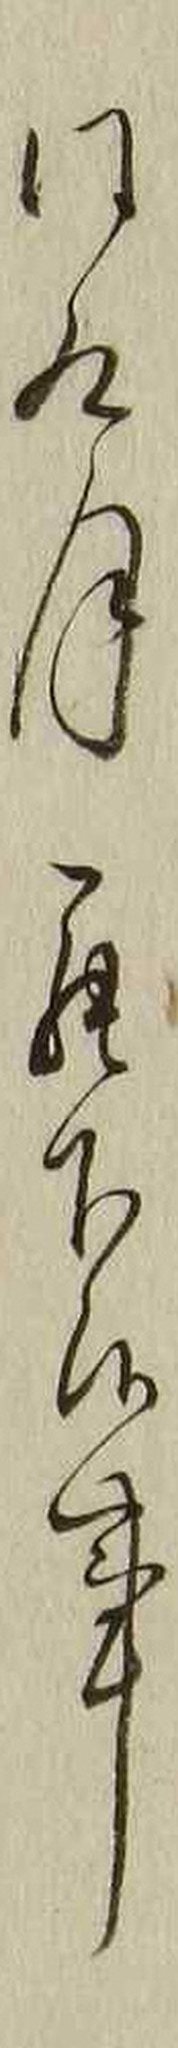同九月罷下候事
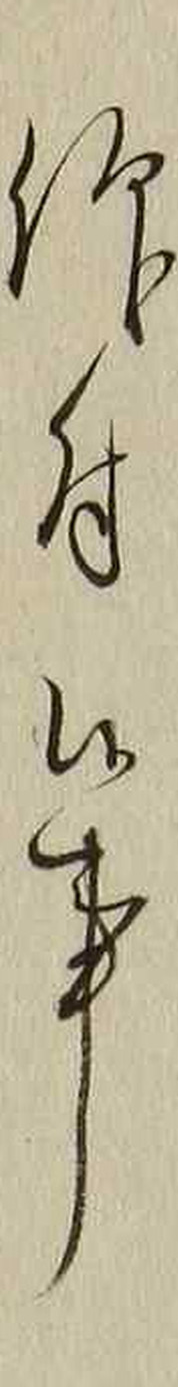仰付候事
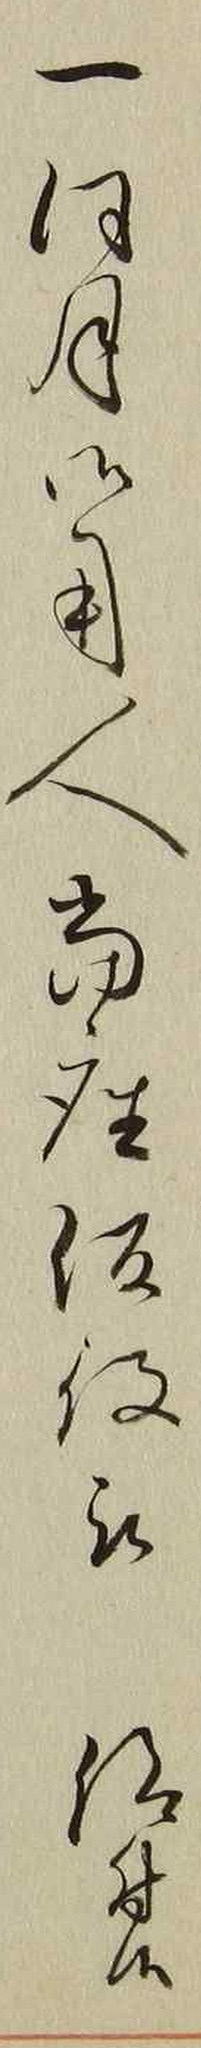一同月御用人当座仮役被仰付候
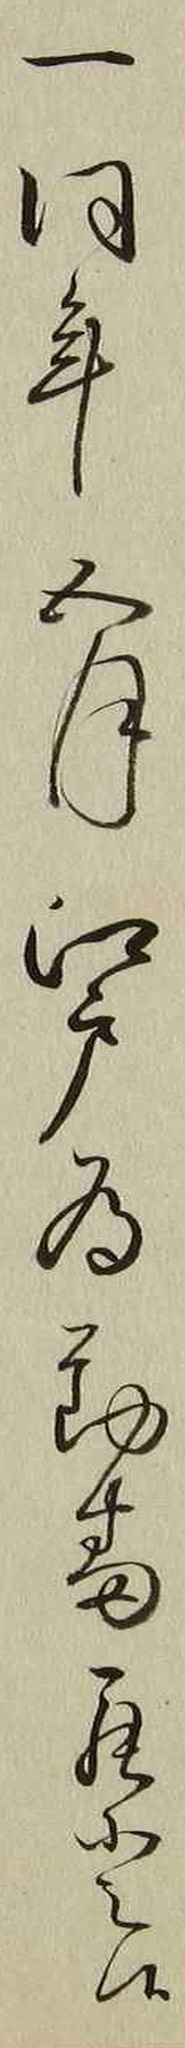一同年五月江戸為勤番罷登候
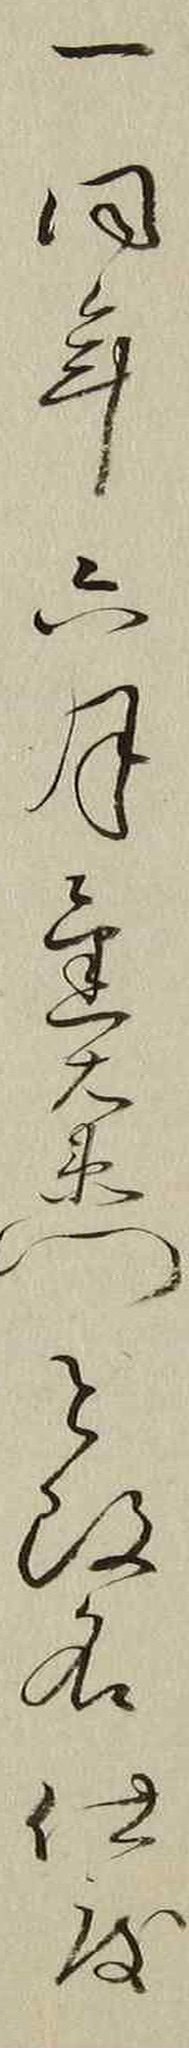一同年六月重右衛門を改名仕度
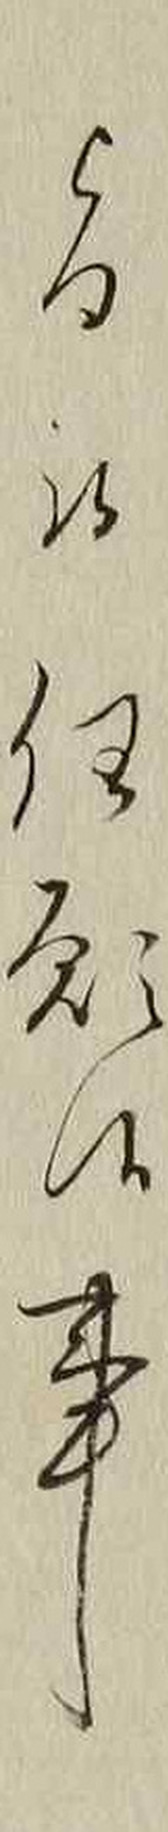旨被任願候事
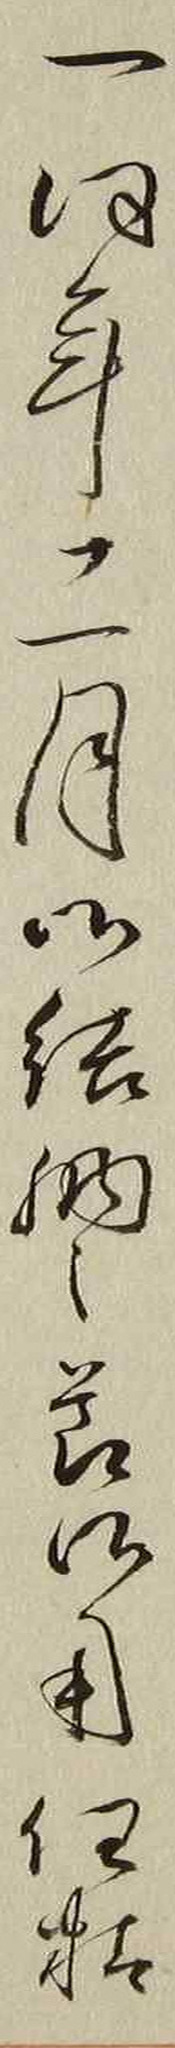一同年十一月御結納之節御用任精
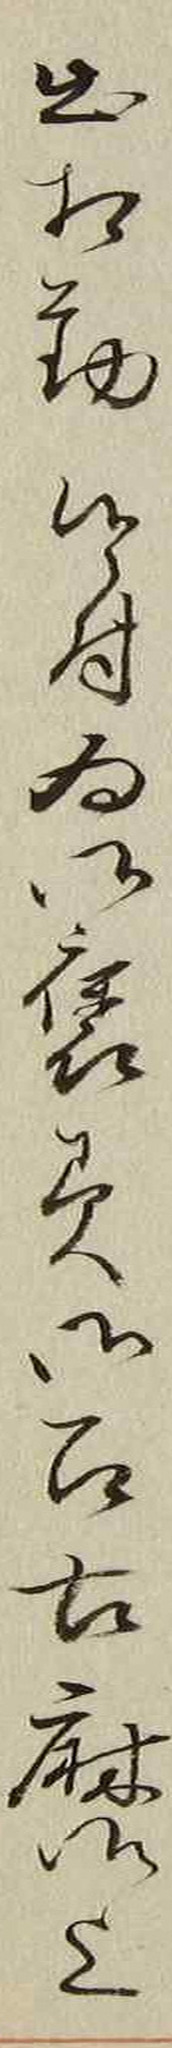出相勤候ニ付為御褒美御召古麻御上
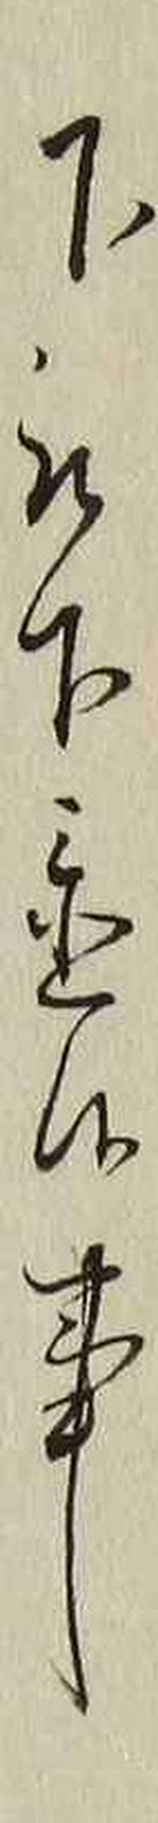下被下置候事
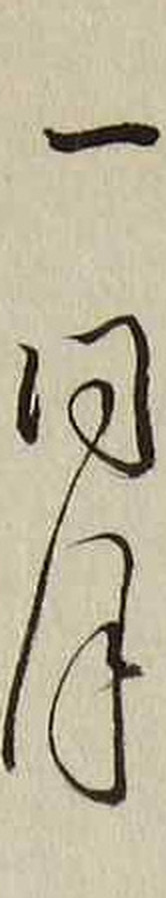一同月
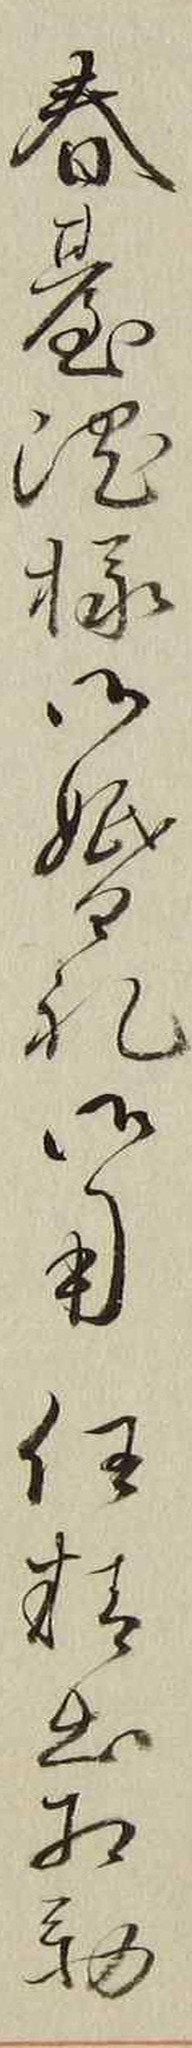春台院様御婚礼御用任精出相勤
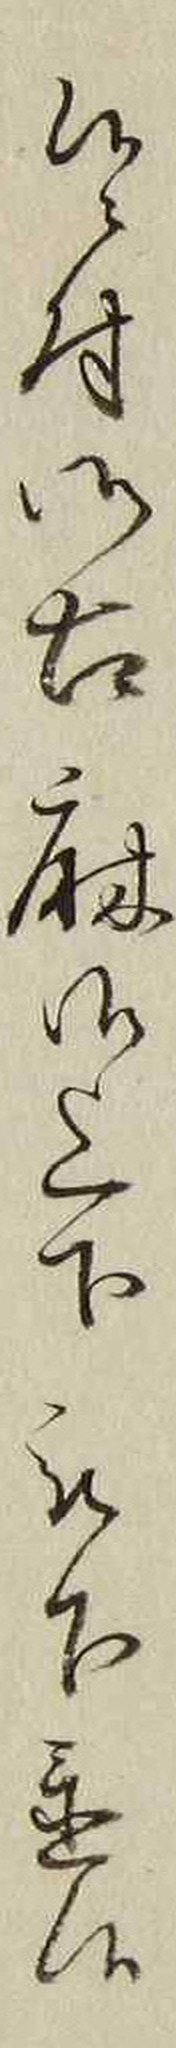候ニ付御古麻御上下被下置候
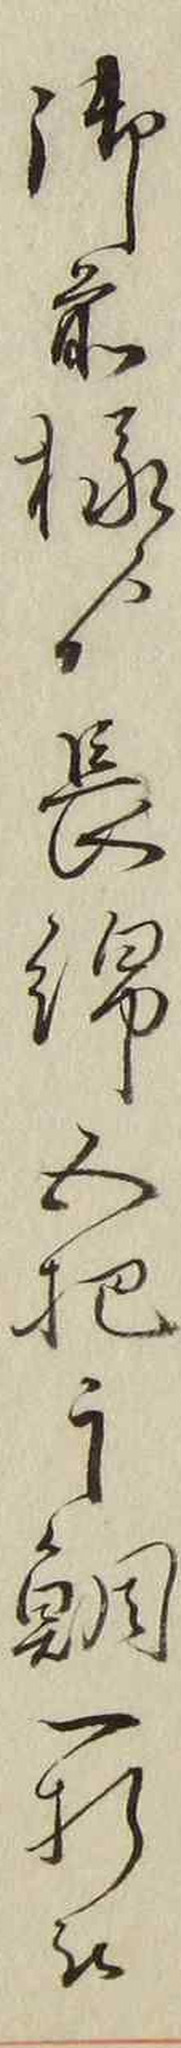御前様ゟ長綿五把干鯛一折被

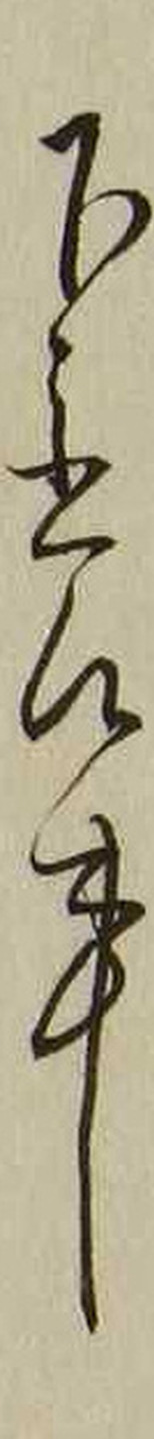下置候事
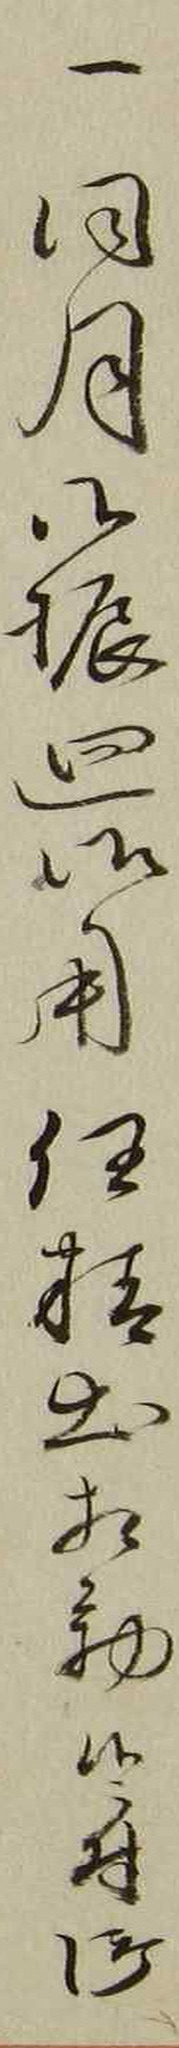一同月御振廻御用任精出相勤候ニ付御
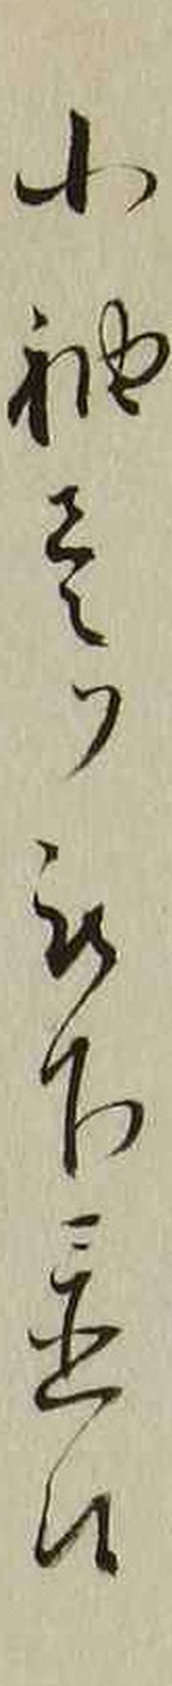小袖壱ツ被下置候
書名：諸士系譜　巻之2　い之部2
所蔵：会津若松市立会津図書館
